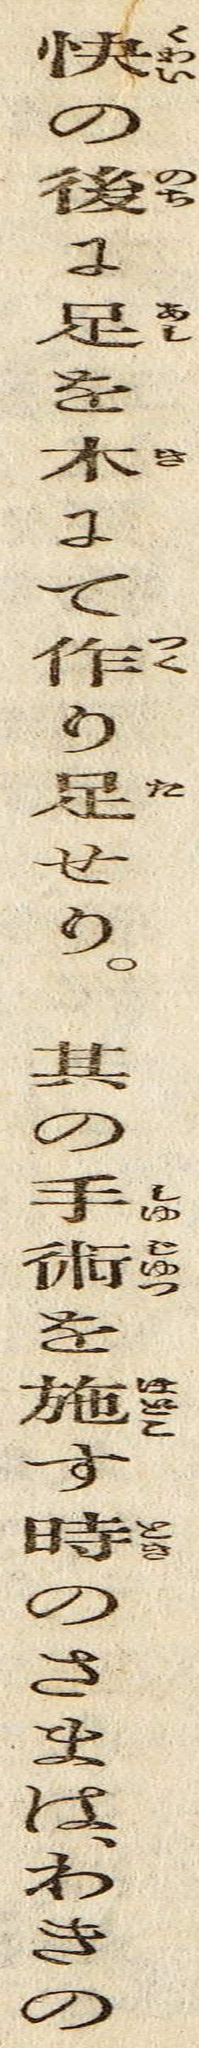快の後に足を木にて作り足せり。其の手術を施す時のさまは、わきの
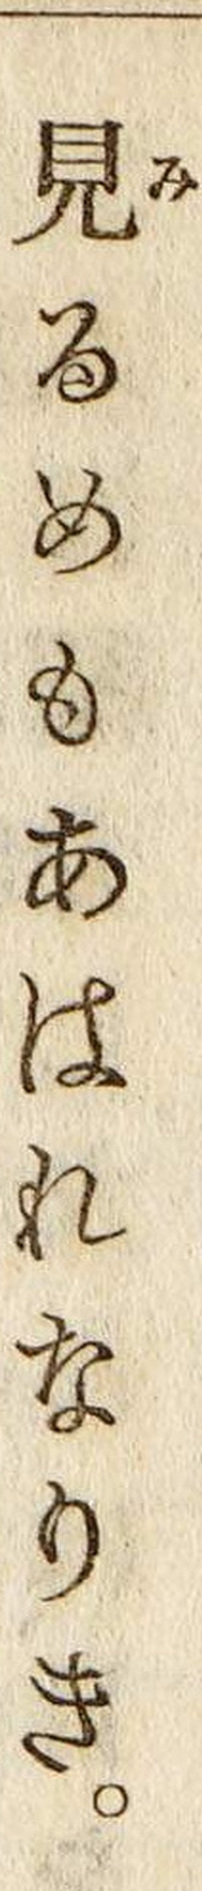見るめもあはれなりき。
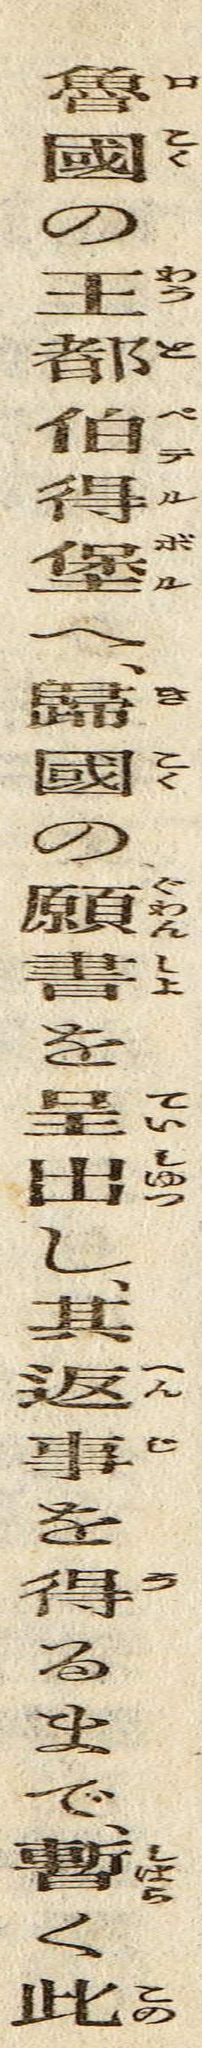魯国の王都伯得堡へ、帰国の願書を呈出し、其返事を得るまで、此
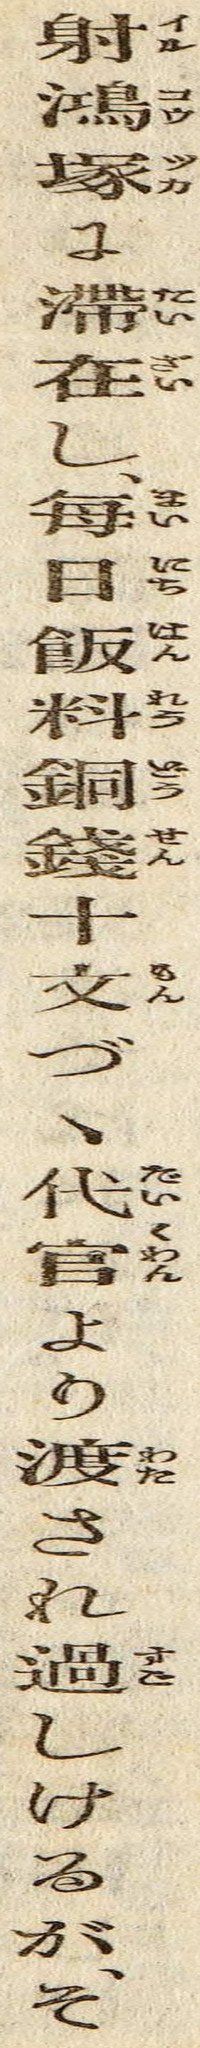射鴻塚に滞在し、毎日飯料銅銭十文づゝ代官より渡され過ごしけるが、そ
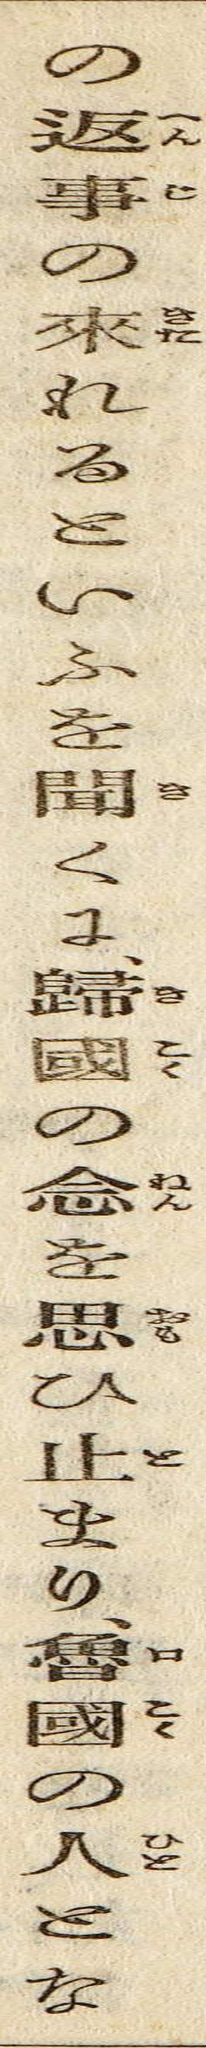の返事の来れるといふを聞くに、帰国の念を思ひ止まり、魯国の人とな

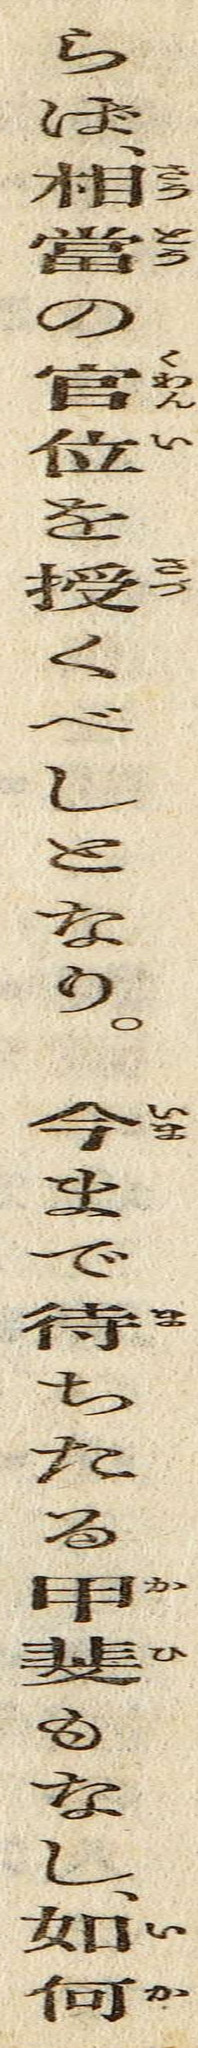らば、相当の官位を授くべしとなり。今まで待ちたる甲斐もなし、如何
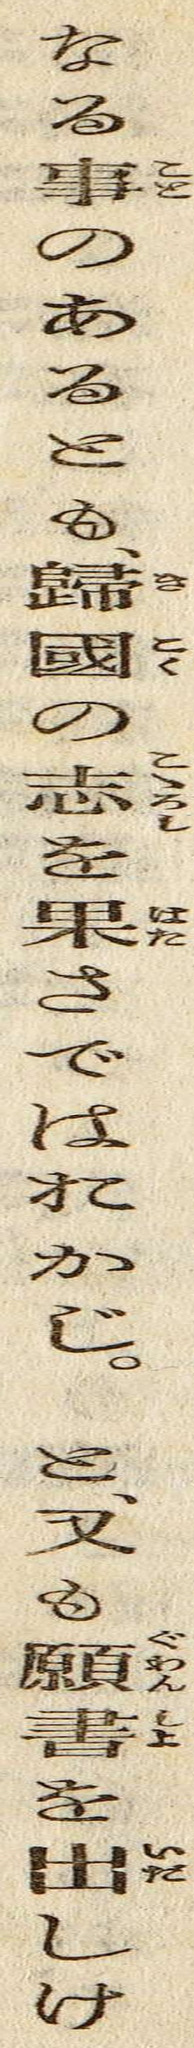なる事のあるとも、帰国の志を果さではおかじ。と、又も願書を出しけ
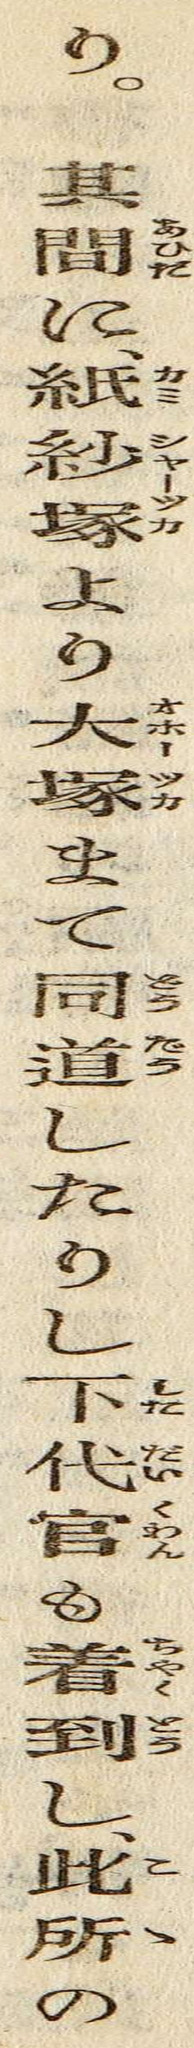り。其間に紙紗塚より大塚まて同道したりし下代官も着到し、此所の
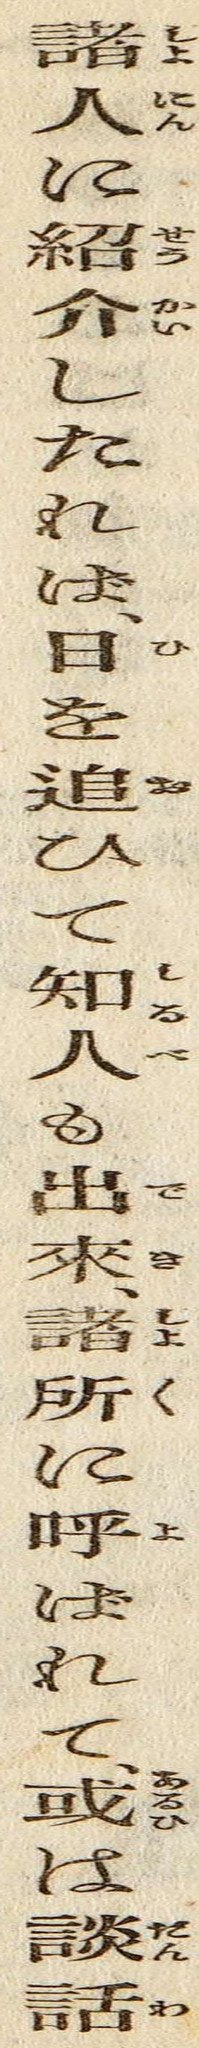諸人に紹介したれば、日を追ひて知人も出来、諸所に呼ばれて、或は談話
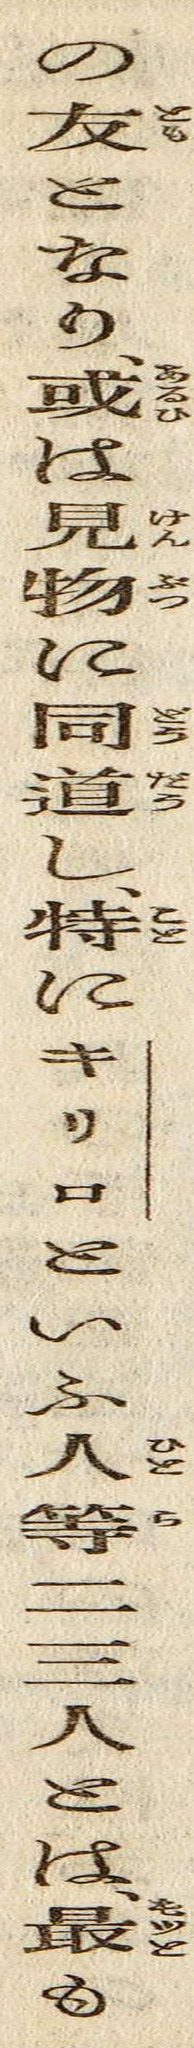の友となり、或は見物に同道し、特にキリロといふ人等二三人とは、最も
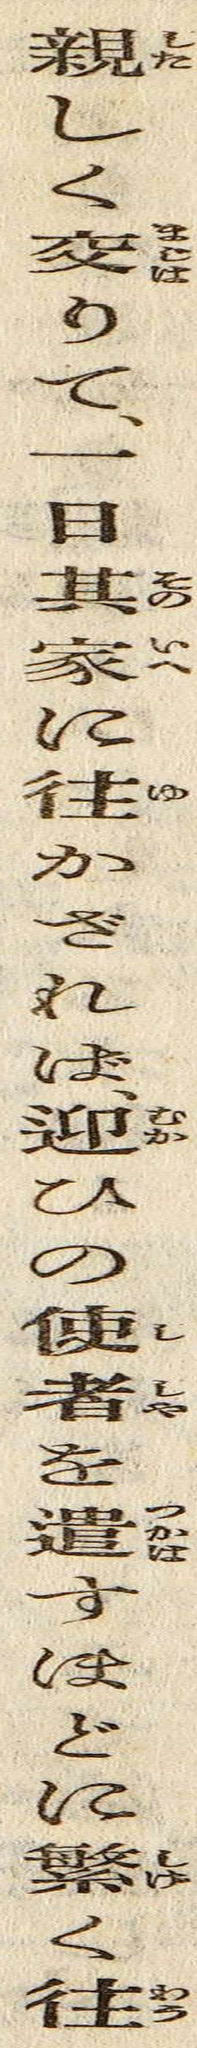親しく交りて一日其家に往かざれば、迎ひの使者を遣すほどに繁く往
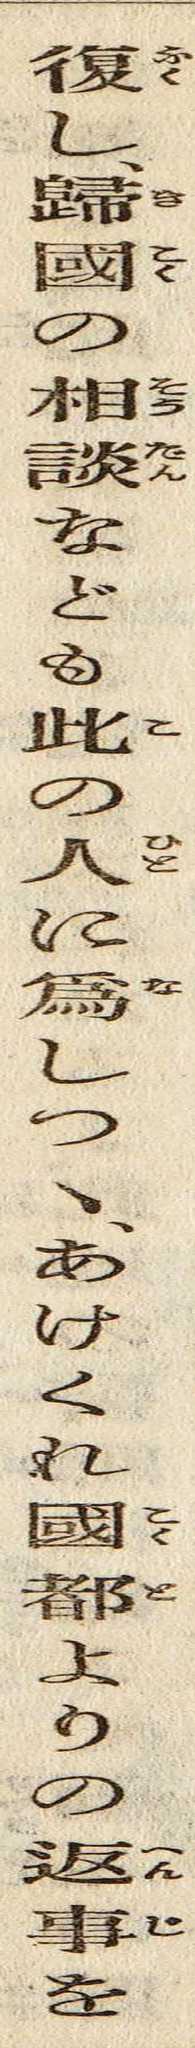復し、帰国の相談なども此の人に為しつゝ、あけくれ国都よりの返事を
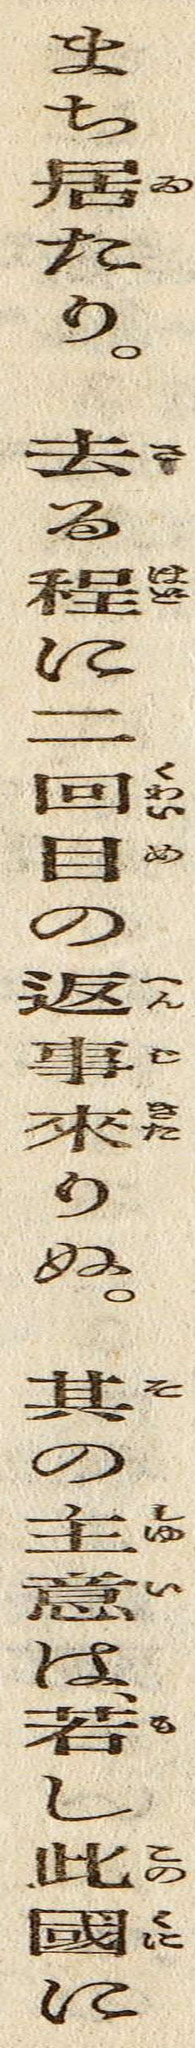まち居たり。去る程に二回目の返事来りぬ。其の主意は、若し此国に
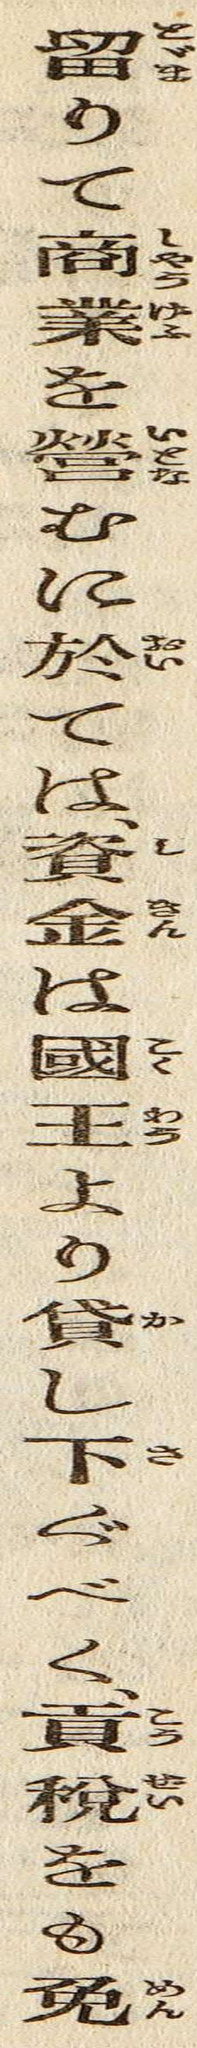留りて商業を営むに於ては、資金は国王より貸し下ぐべく、貢税をも免
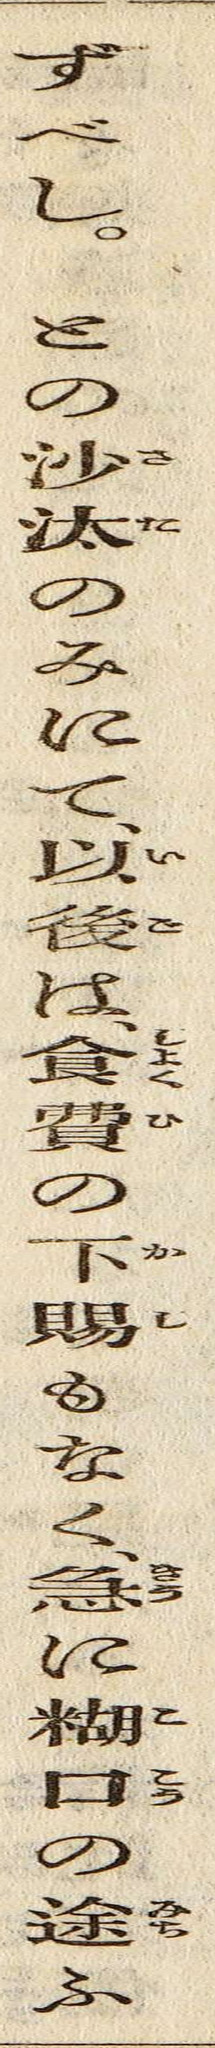ずべし。との沙汰のみにて、以後は、食費の下賜もなく、急に糊口の途ふ
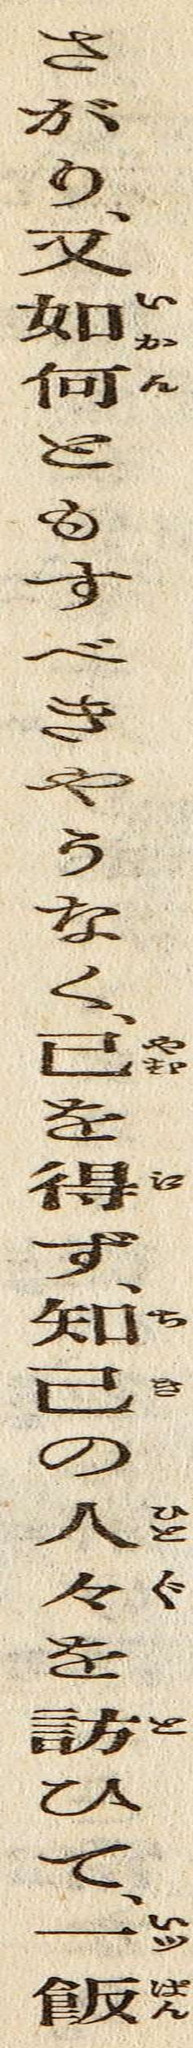さがり、又如何ともすべきやうなく、已を得ず、知己の人々を訪ひて、一飯
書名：日本漂流譚
